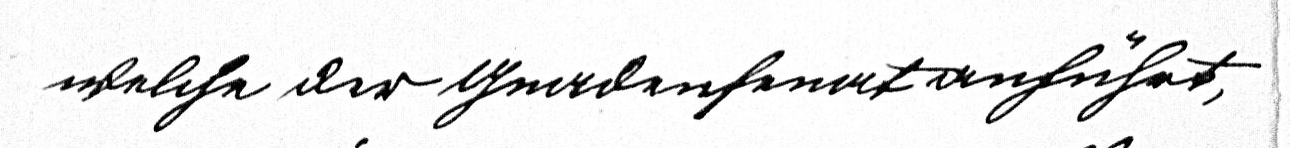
welche der Gnadensenat anführt,
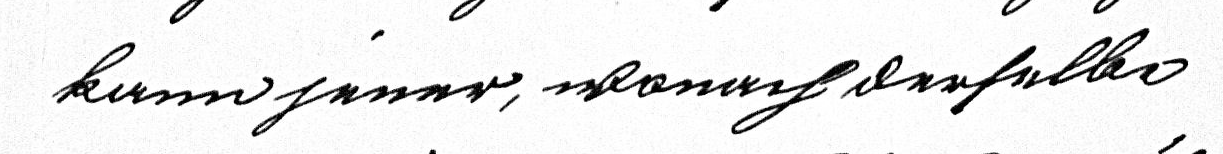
kann jener, wonach derselbe
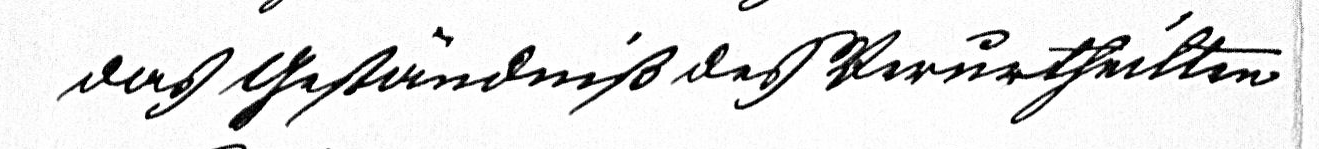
das Geständniß des Verurtheilten
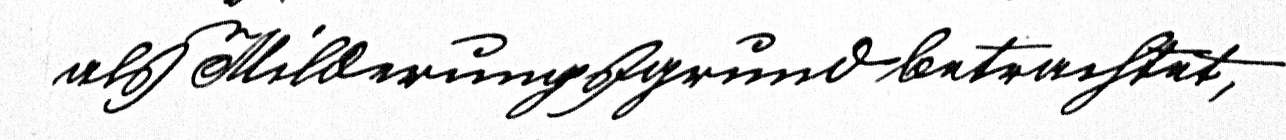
als Milderungsgrund betrachtet,
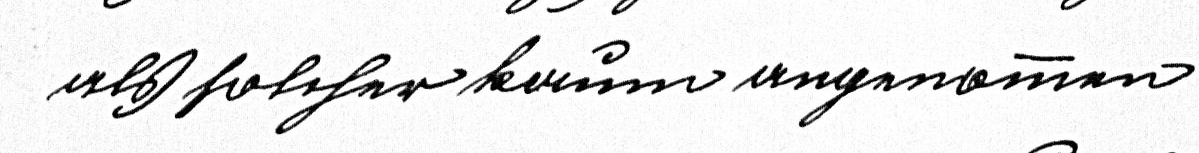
als solcher kaum angenommen
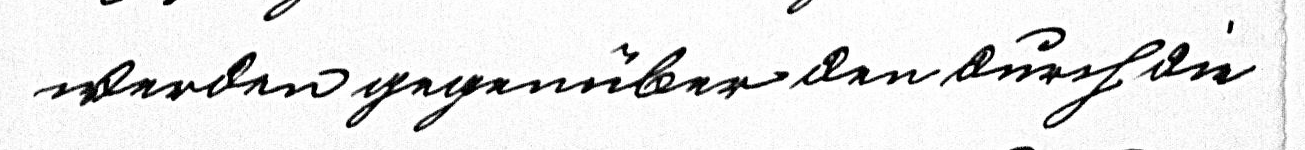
werden gegenüber den durch die
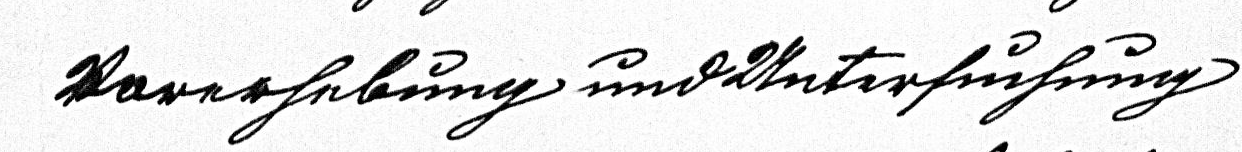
Vorerhebung und Untersuchung
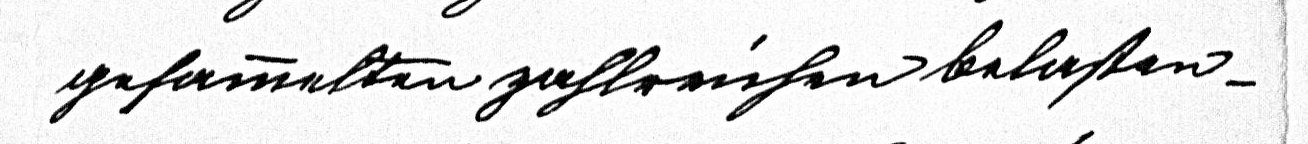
gesammelten zahlreichen belasten¬
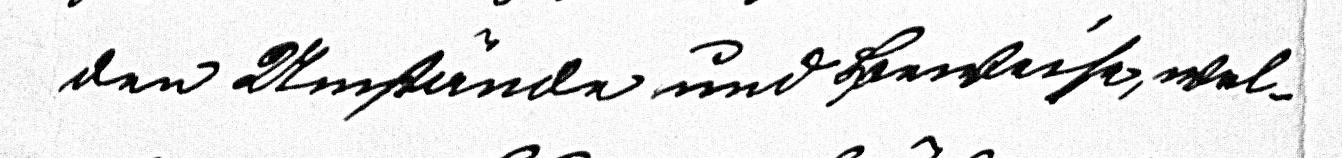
den Umstände und Beweise, wel
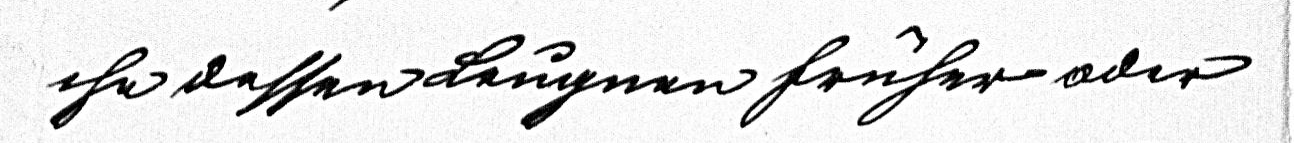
che dessen Leugnen früher oder
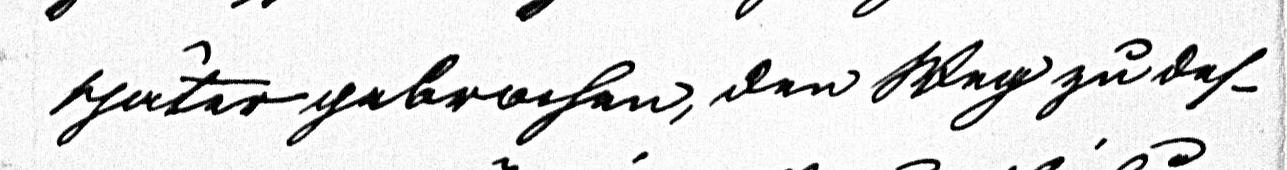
später gebrochen, den Weg zu des¬
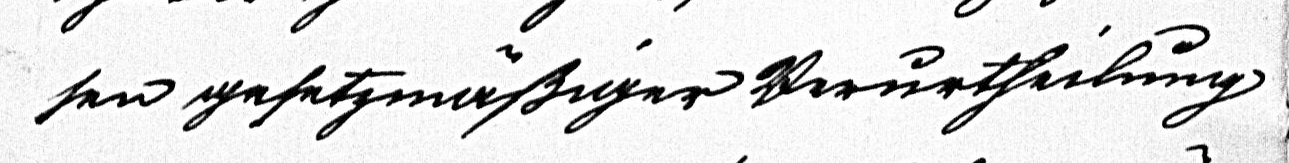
sen gesetzmäßiger Verurtheilung
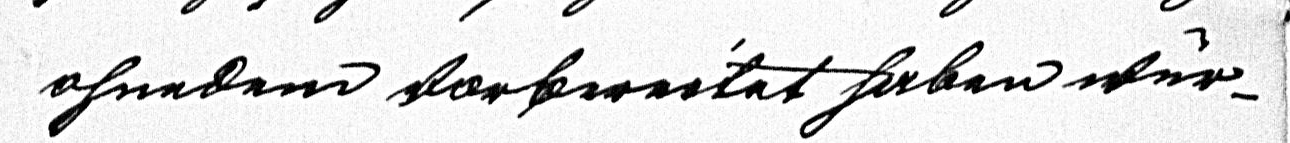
ohnedem vorbereitet haben wür¬
